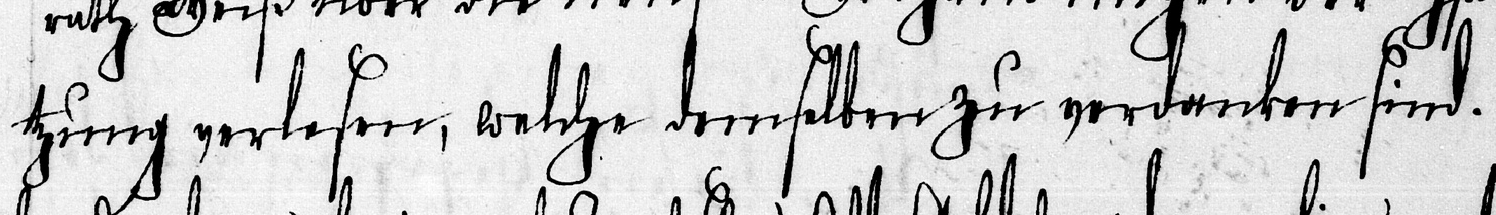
tzung verlesen, welche demselben zu verdanken sind.
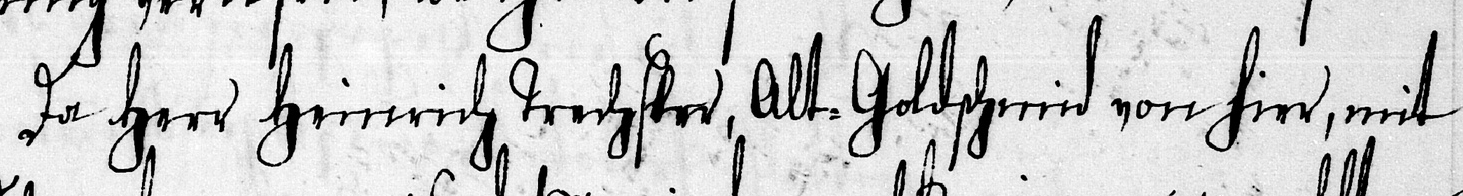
Da Herr Heinrich Trachsler, Alt-Goldschmid von hier, mit
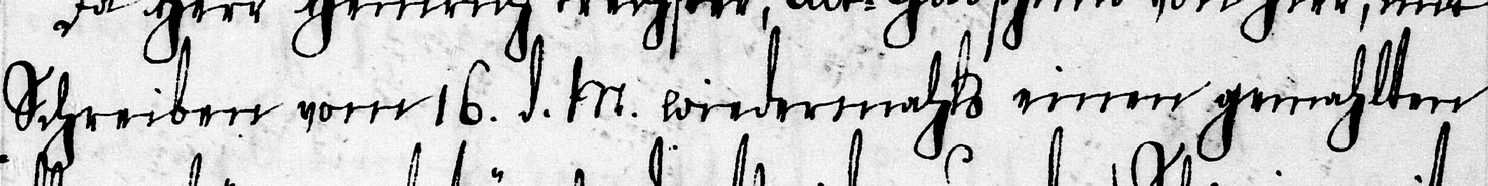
Schreiben vom 16. d. M. wiedermahls einen gemahlten
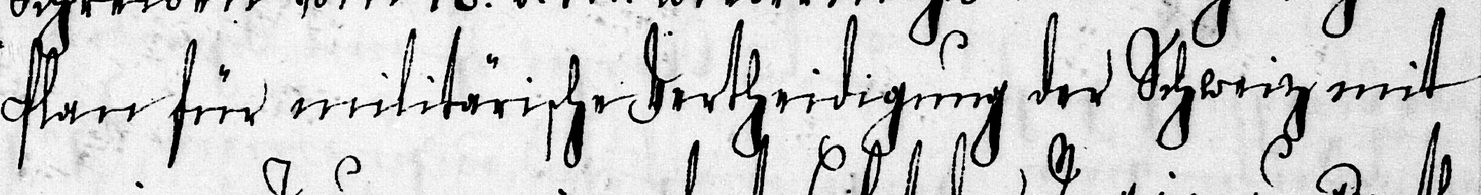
Plan für militärische Vertheidigung der Schweiz mit
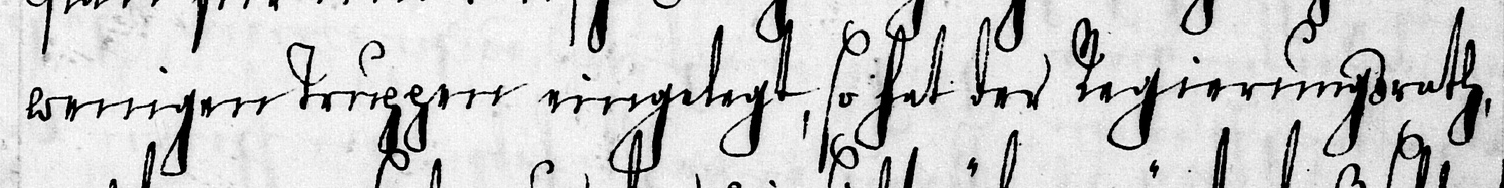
wenigen Truppen eingelegt, so hat der Regierungsrath,
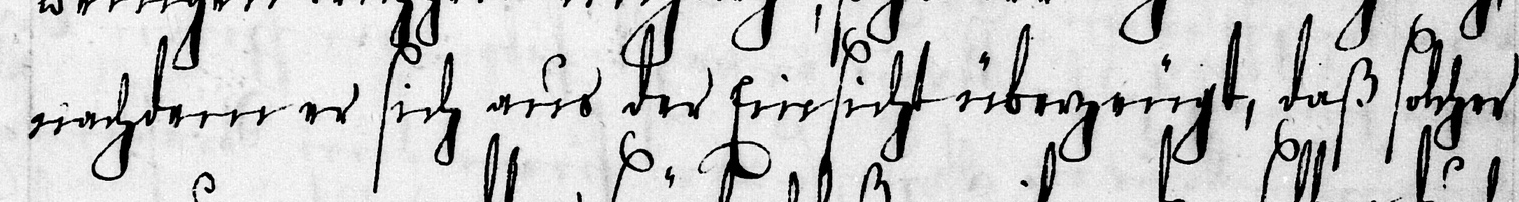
nachdem er sich aus der Einsicht überzeugt, daß solcher
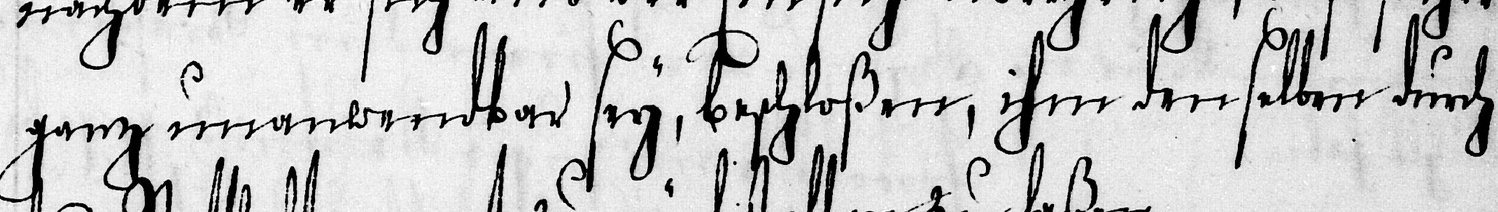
ganz unanwendbar sey, beschloßen, ihm denselben durch
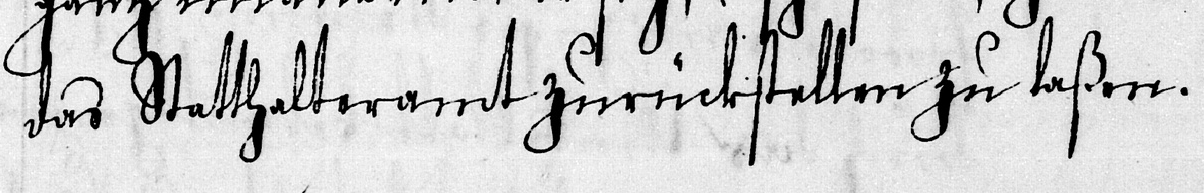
das Statthalteramt zurückstellen zu laßen.
